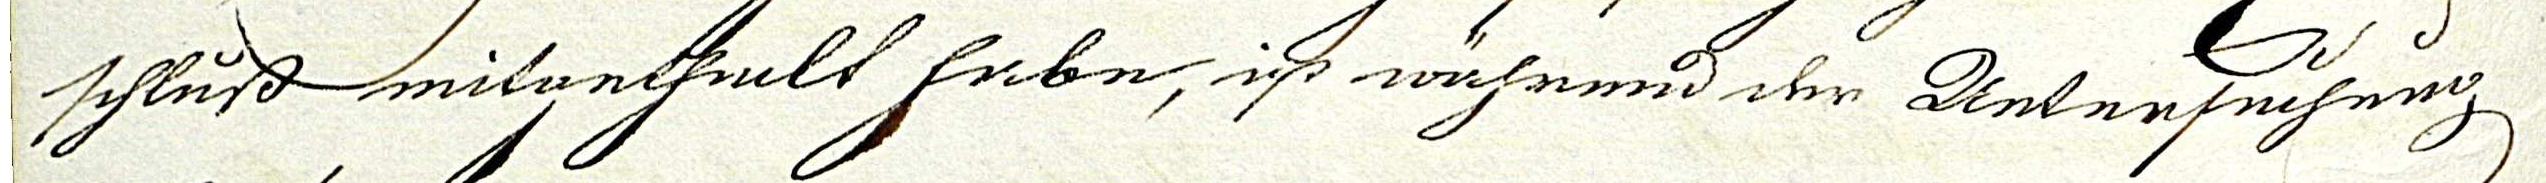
schluß mitgetheilt habe, ist während der Untersuchung
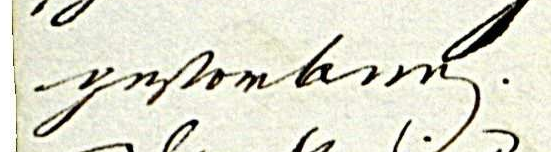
gestorben.
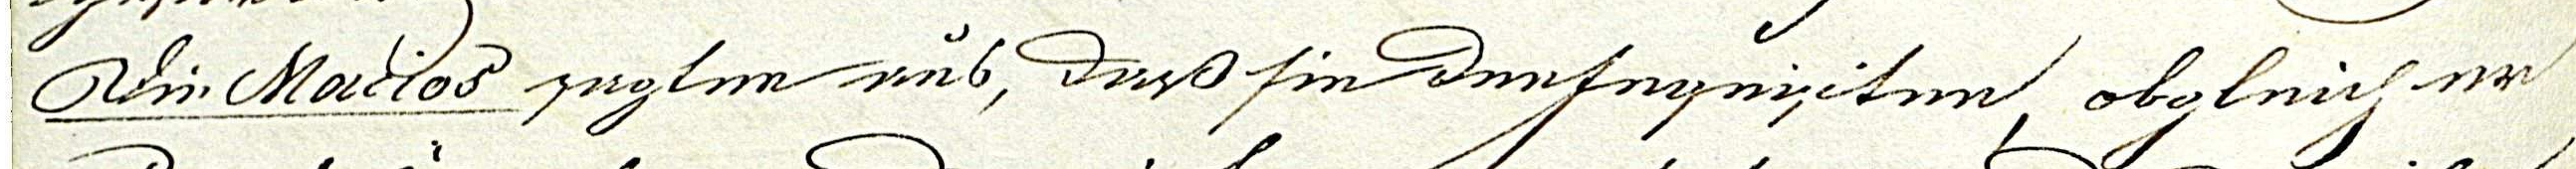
Die Macios sagten aus, daß sie den Inquisiten, obgleich er
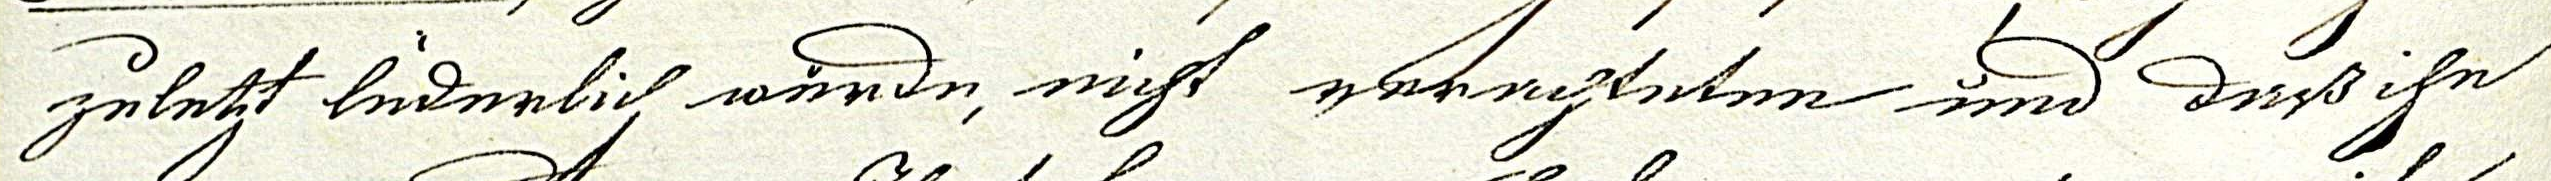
zuletzt lüderlich würde, nicht verachteten und daß ihn
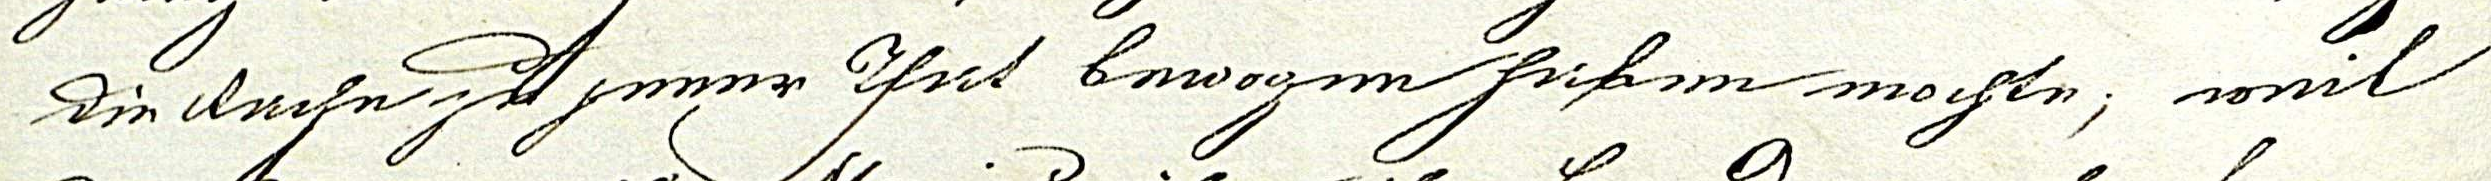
die Rache zu jener That bewogen haben mochte; weil
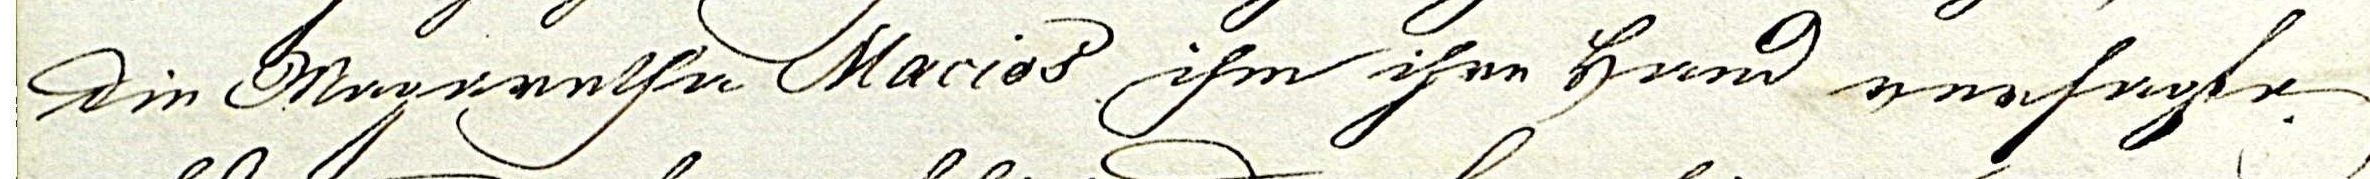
die Magaretha Macios ihm ihre Hand versagte.
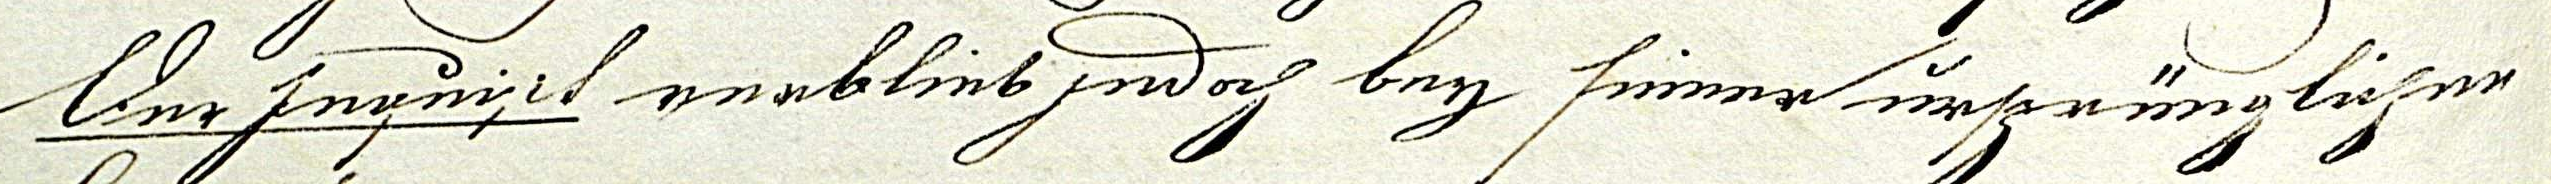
Der Inquisit verblieb jedoch bey seiner ursprünglichen
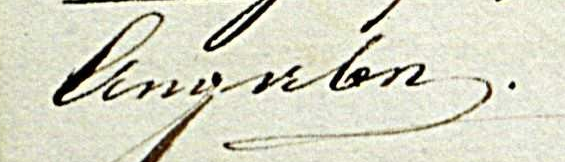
Angaben.
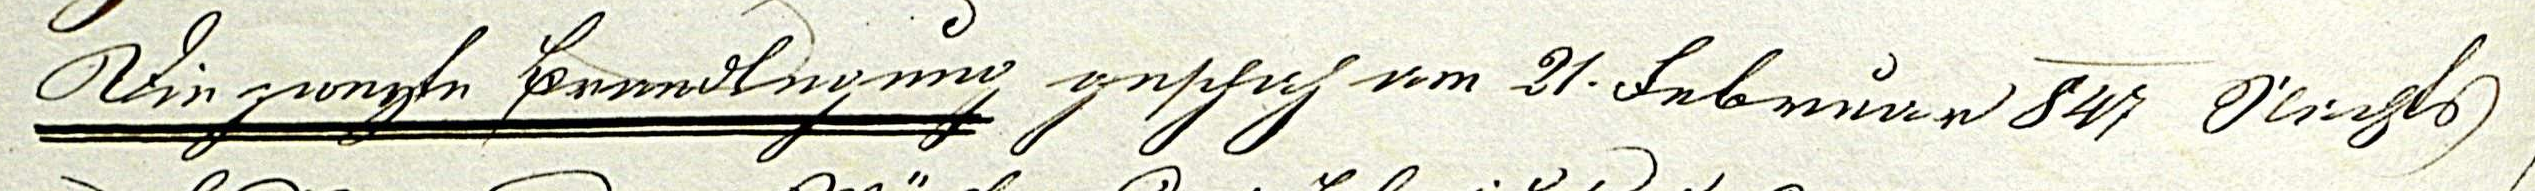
Die zweyte Brandlegung geschah am 21. Februar [1]847 Nachts
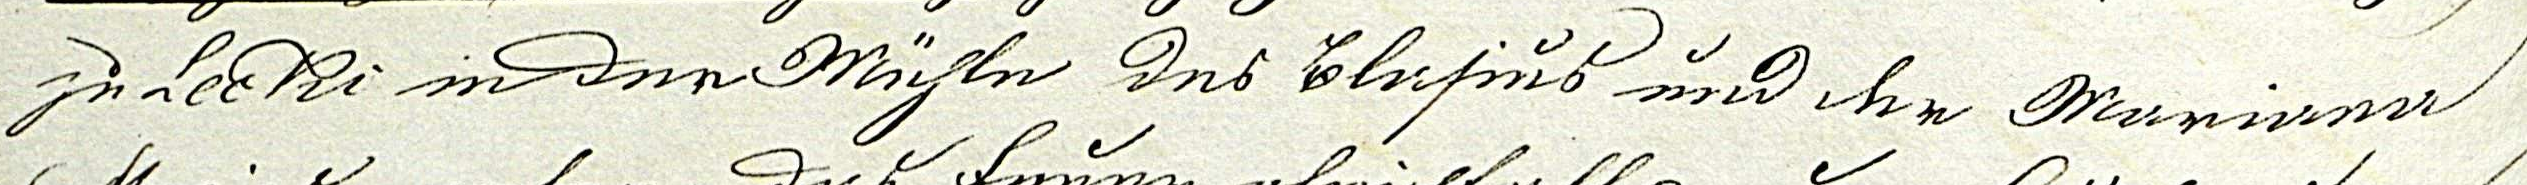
zu Lęki in der Mühle des Blasius und der Mariana
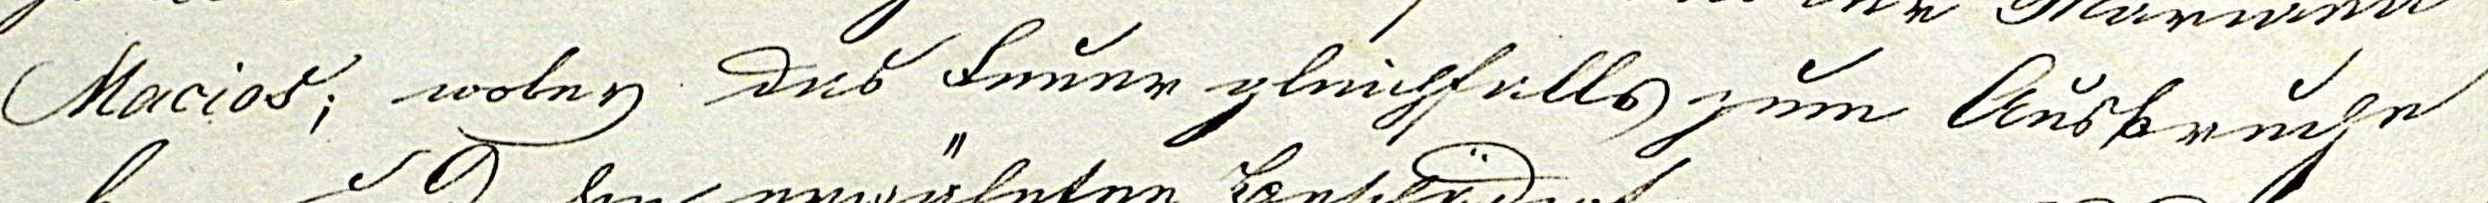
Macios; wobey das Feuer gleichfalls zum Ausbruche
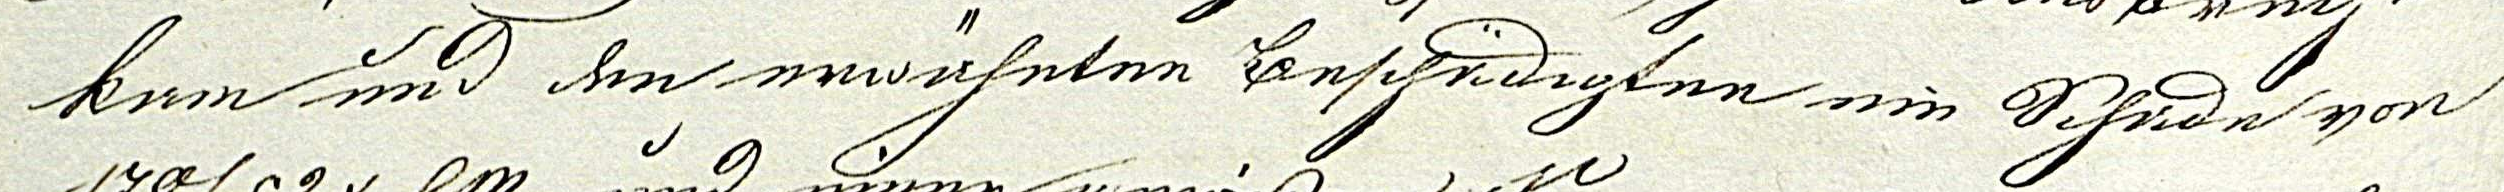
kam und den erwähnten Beschädigten ein Schade von
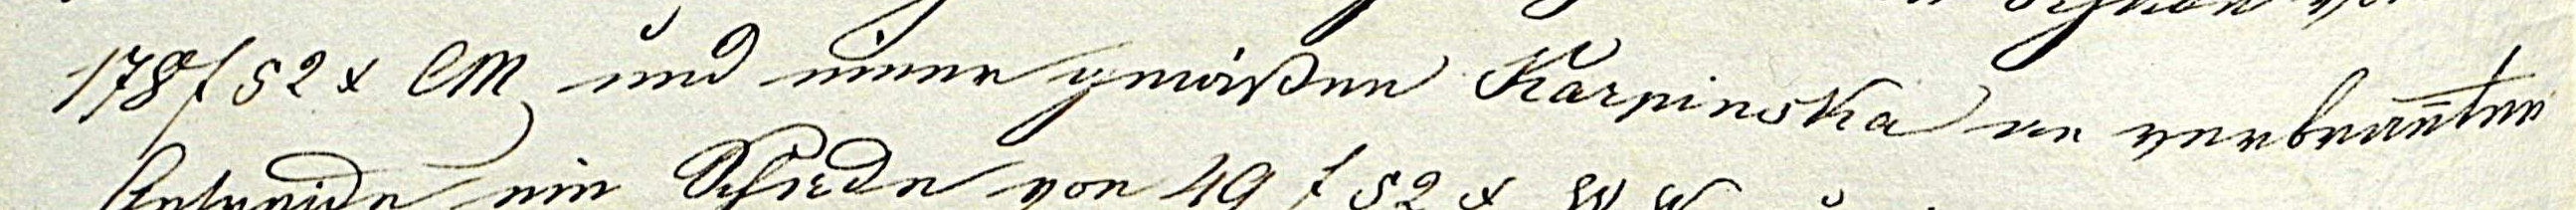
178f52x OM und einer gewißen Karpinska an verbrannten
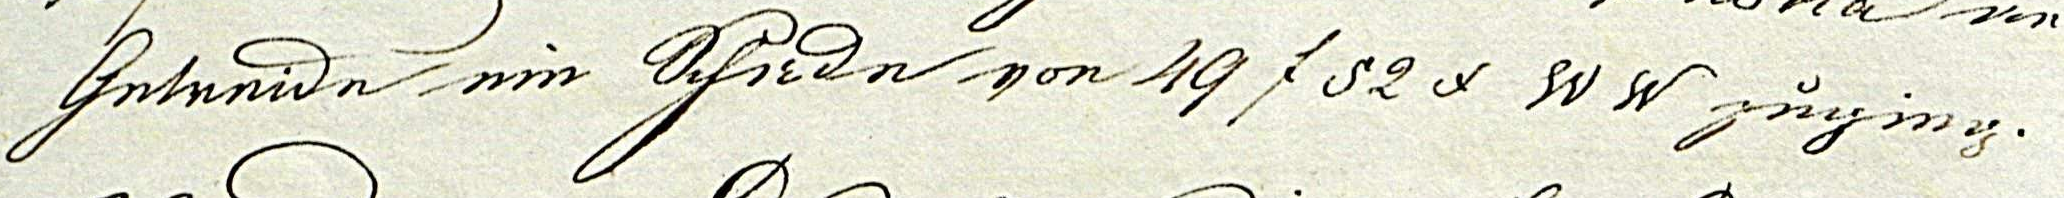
Getreide ein Schade von 49 f 52 x WW zuging.
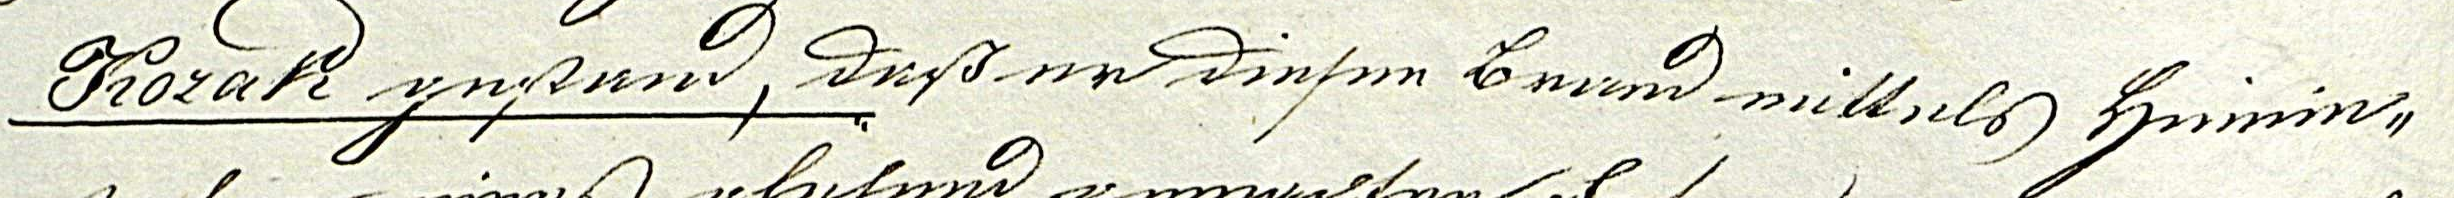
Kozak gestand, daß er diesen Brand mittels Hinein¬
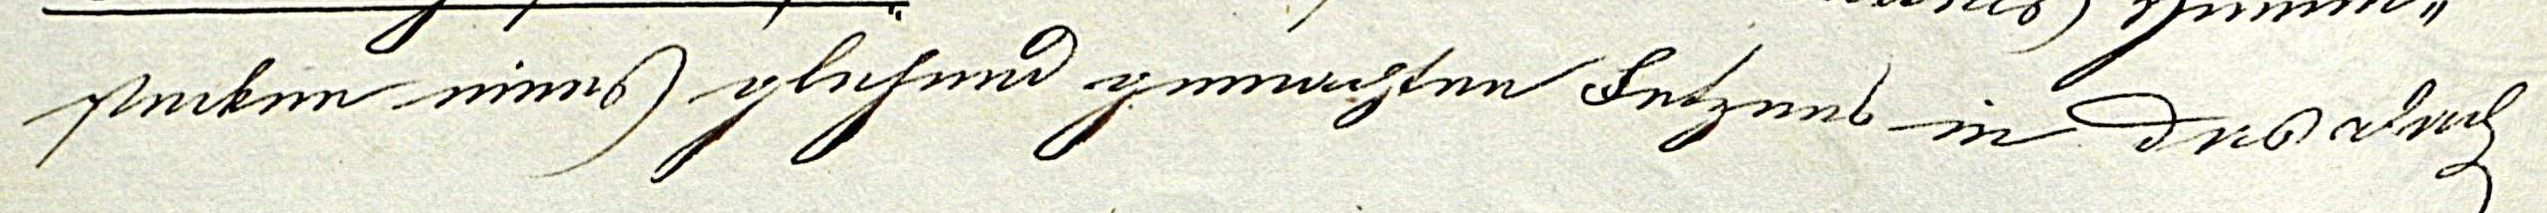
stecken eines glühend gemachten Fetzens in das Dach
